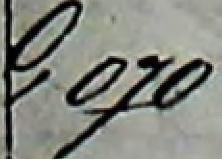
0,070
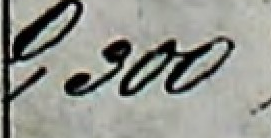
0,300
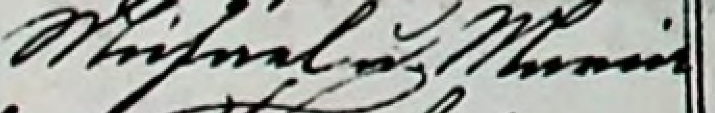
Michael u. Maria
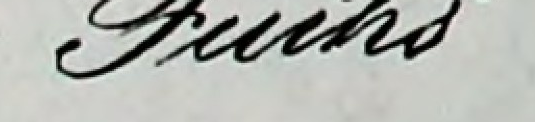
Fuchs
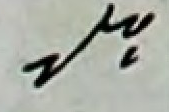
Do
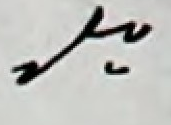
Do
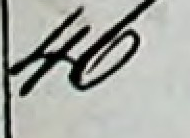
46
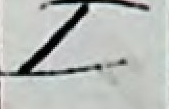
I
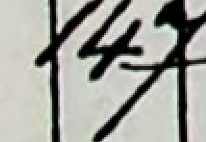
147
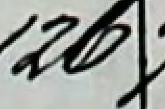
126
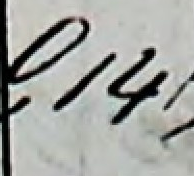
0,14
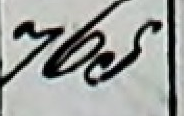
765
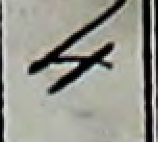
4
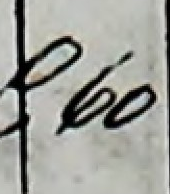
0,60
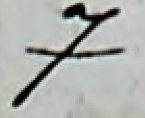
7
